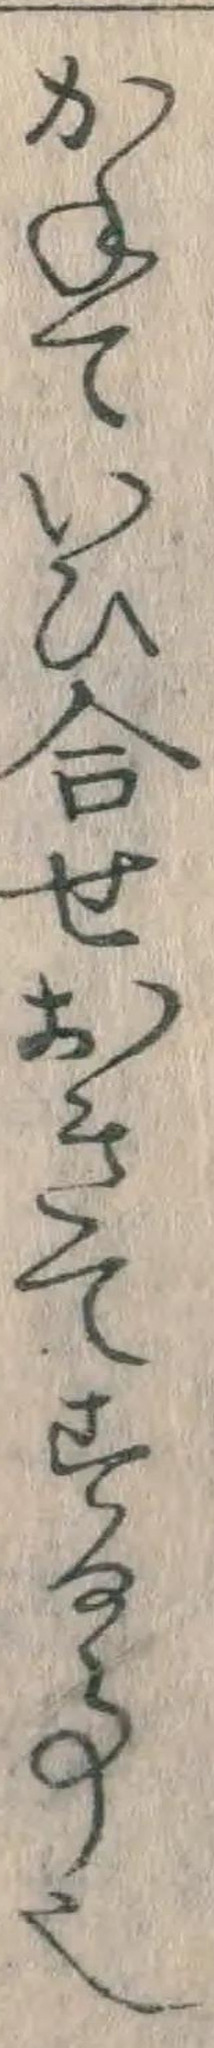かねていひ合せおきてする事也
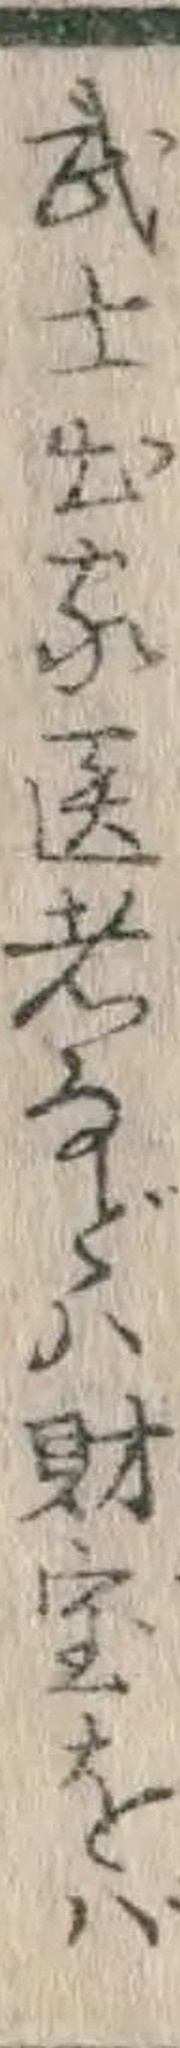武士出家医者などは財宝をば
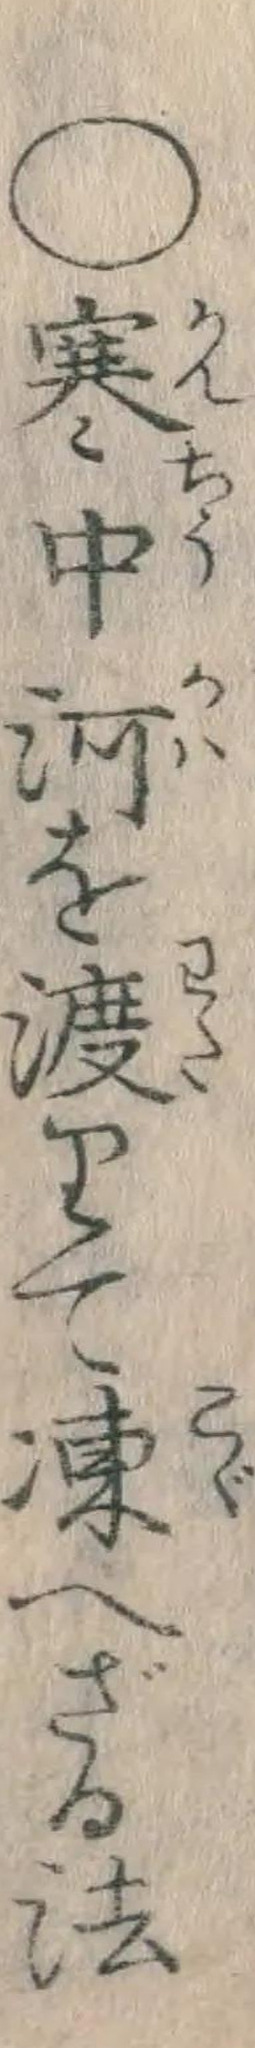○寒中河を渡りて凍へざる法
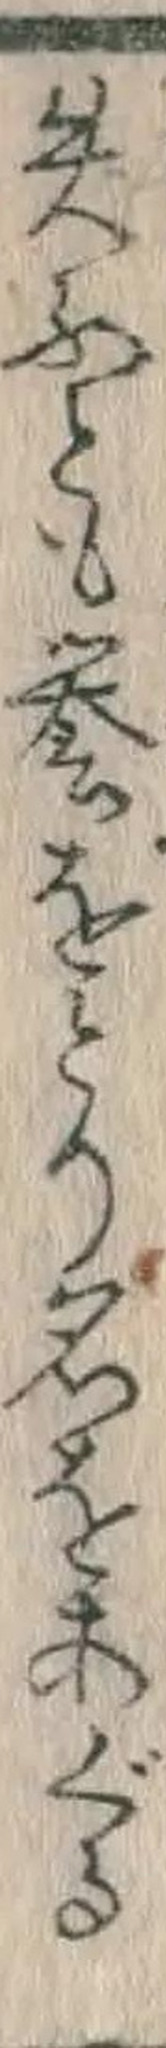失ふとも誉をとり名をあぐる
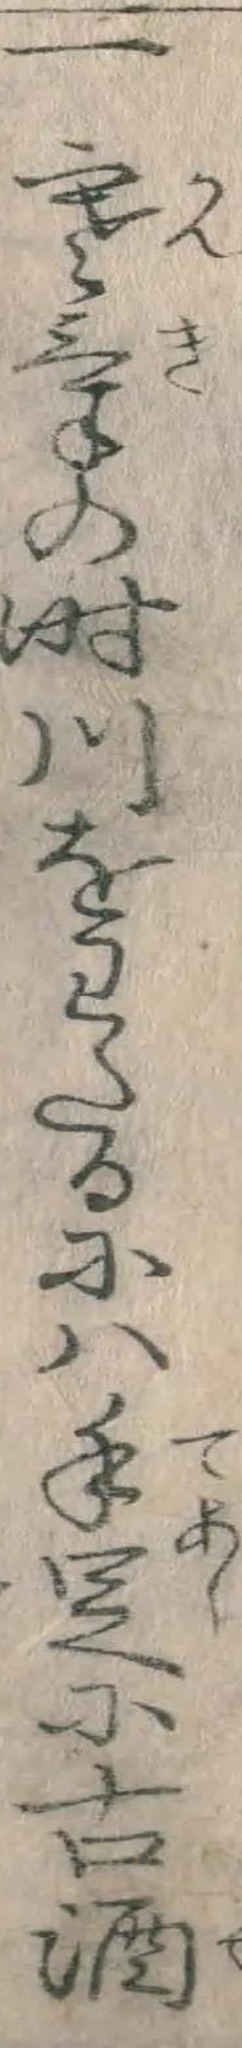一寒気の時川をわたるには手足に古酒
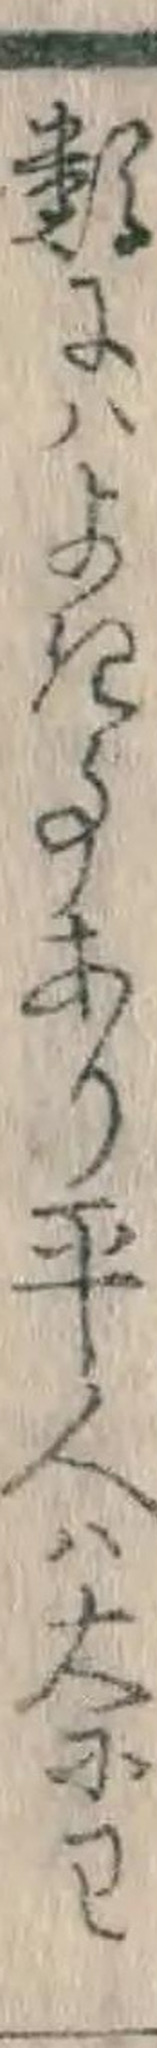類にはよき事あり平人は大にわ
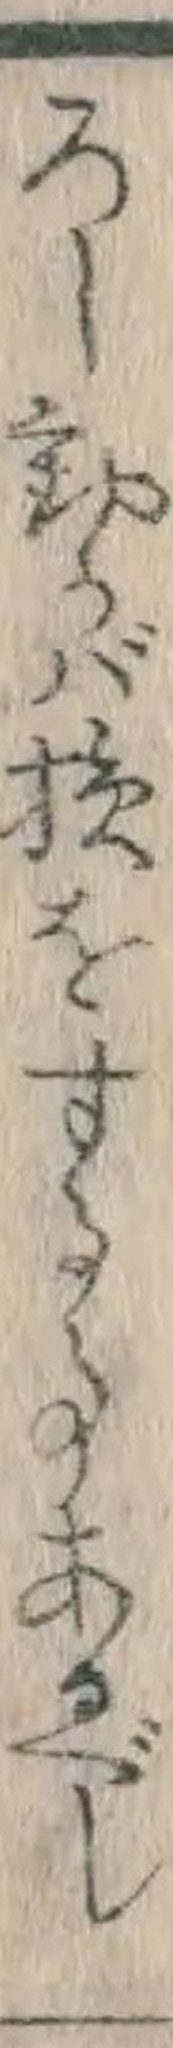ろし動かば損をする事あるべし
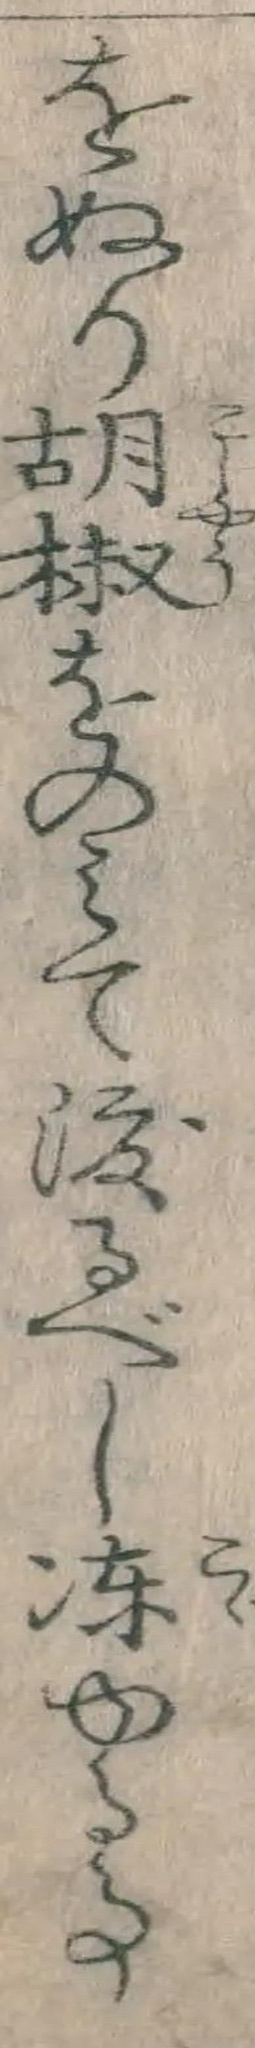をぬり胡椒をのみて渡るべし凍ゆる事
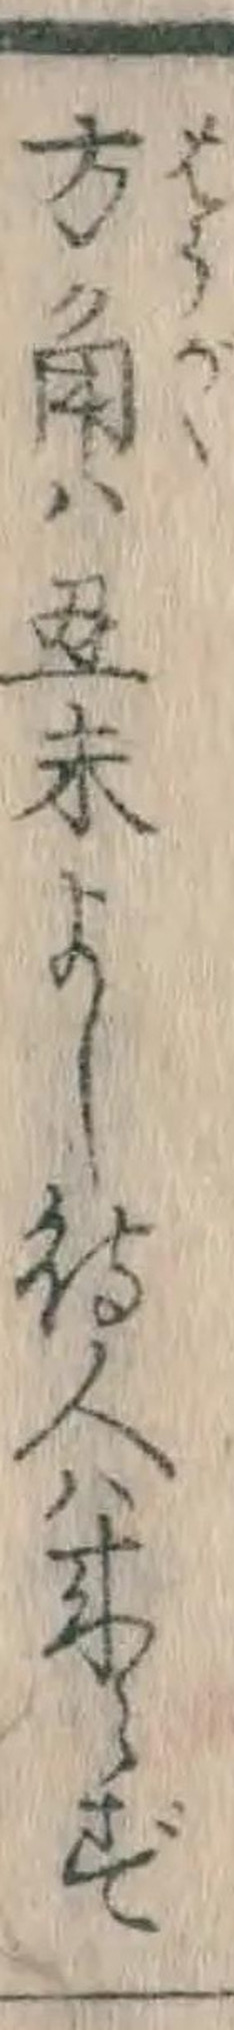方角は丑未よし待人は来らず
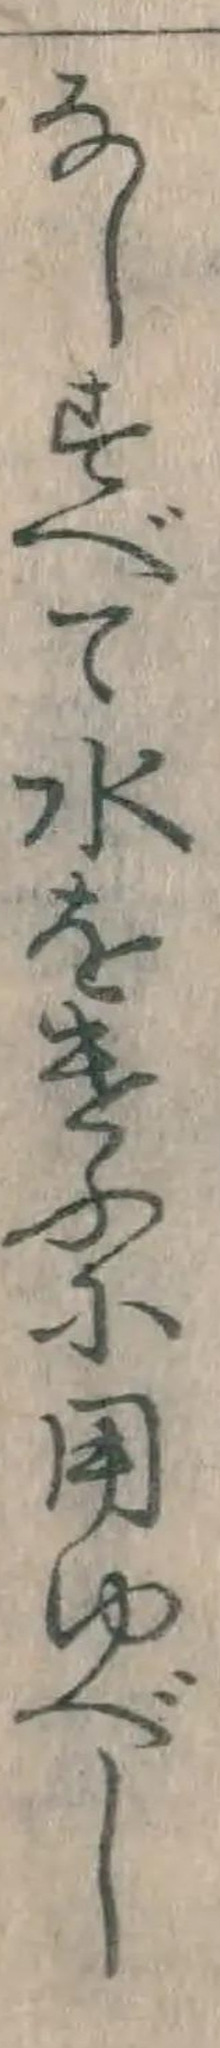なしすべて水を遣ふに用ゆべし

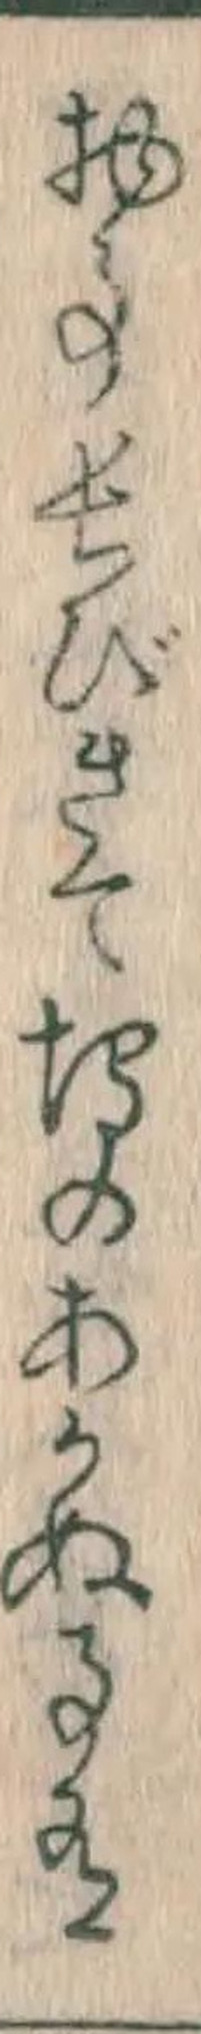物事長びきて埒のあかぬ事有
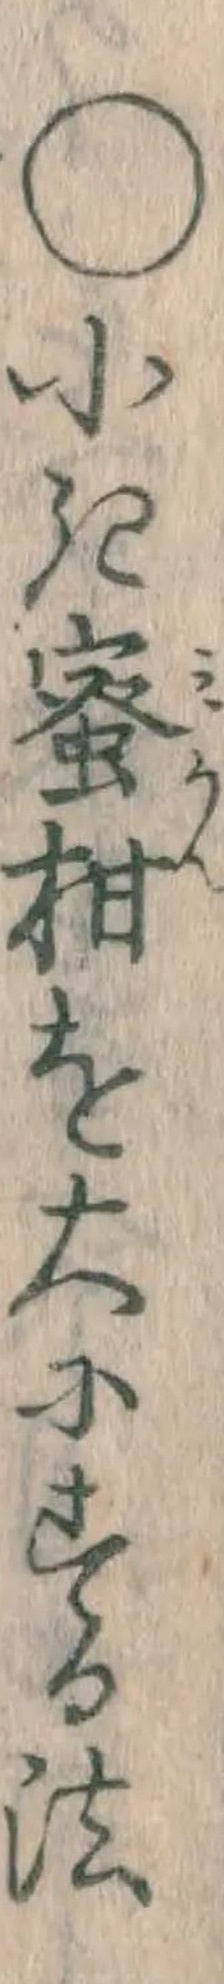○小き蜜柑を大にする法
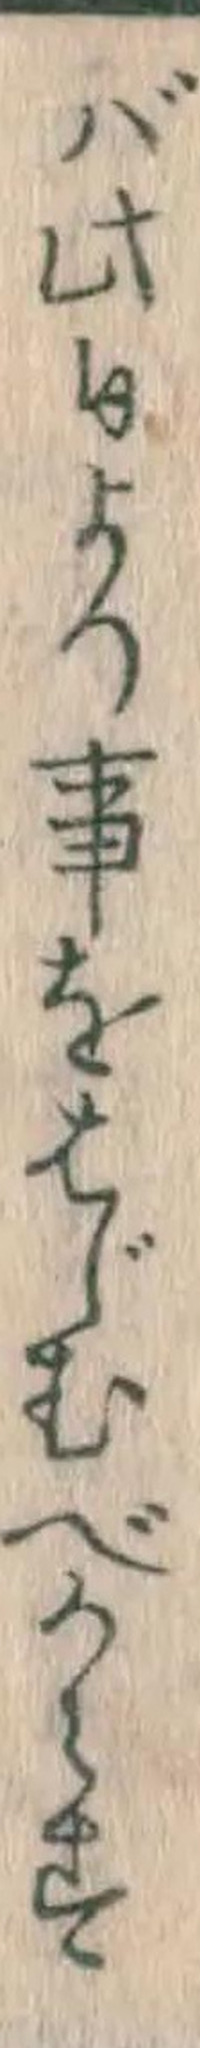ば此日より事をはじむべからす
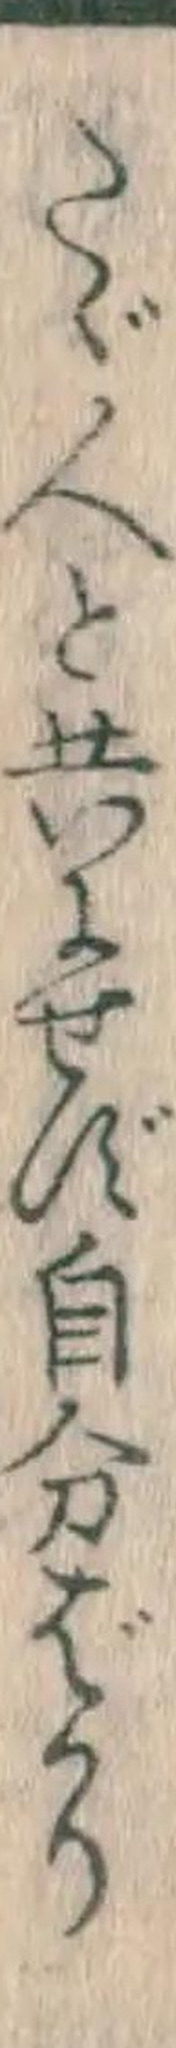たゞ人と共にせず自分ばかり
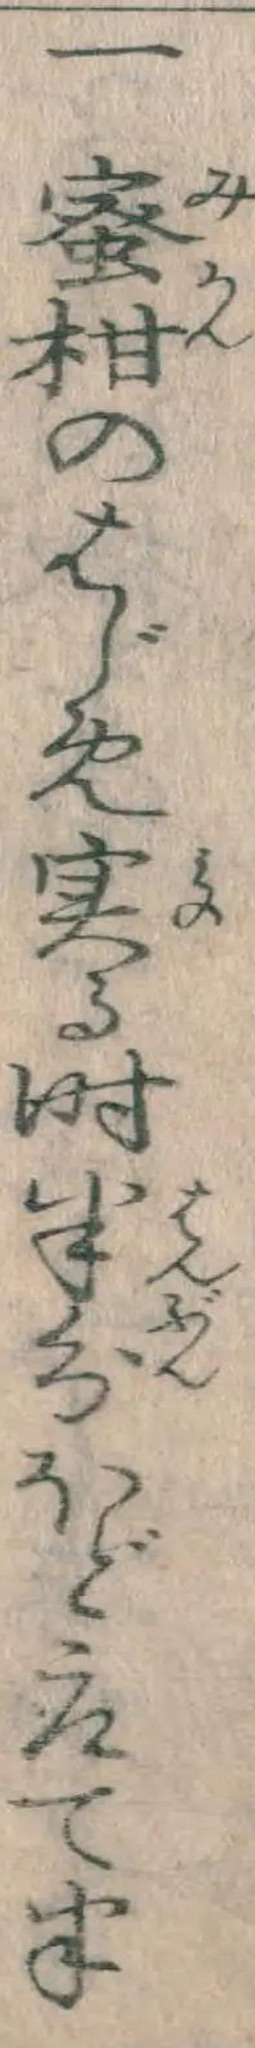一蜜柑のはじめ実る時半分ほど取て半
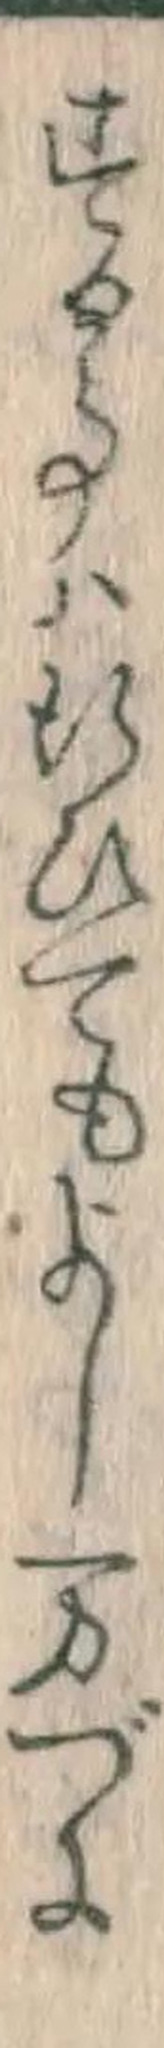する事は行ひてもよし万づに
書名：広益秘事大全 3巻. [2]
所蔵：国立国会図書館 National Diet Library, JAPAN
